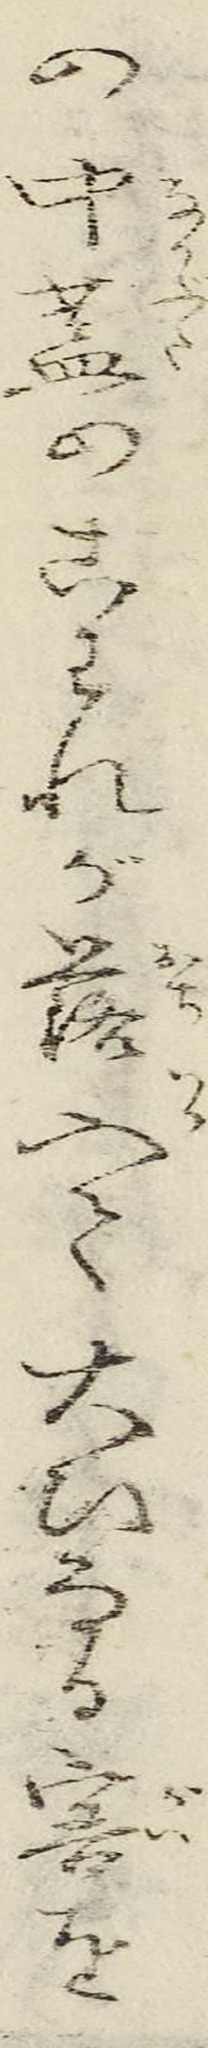の中蓋のこわれが落入て大ひなる害を
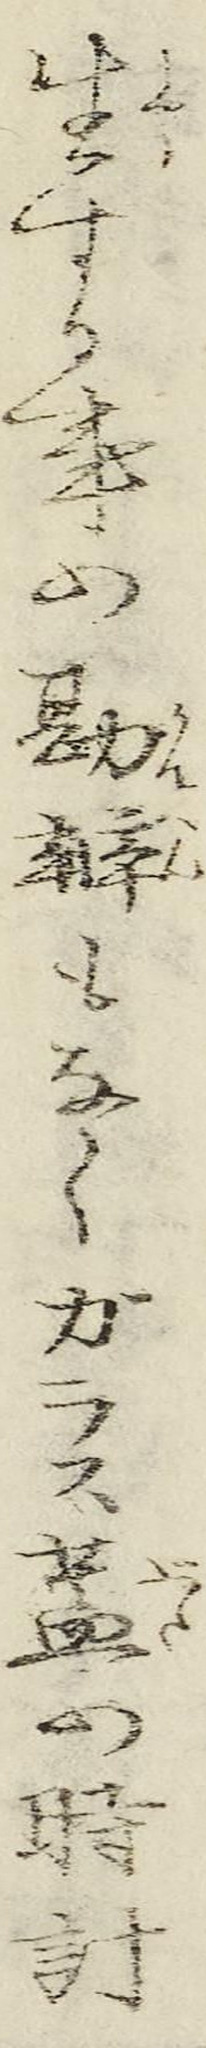生する事の勘弁もなくガラス蓋の時計
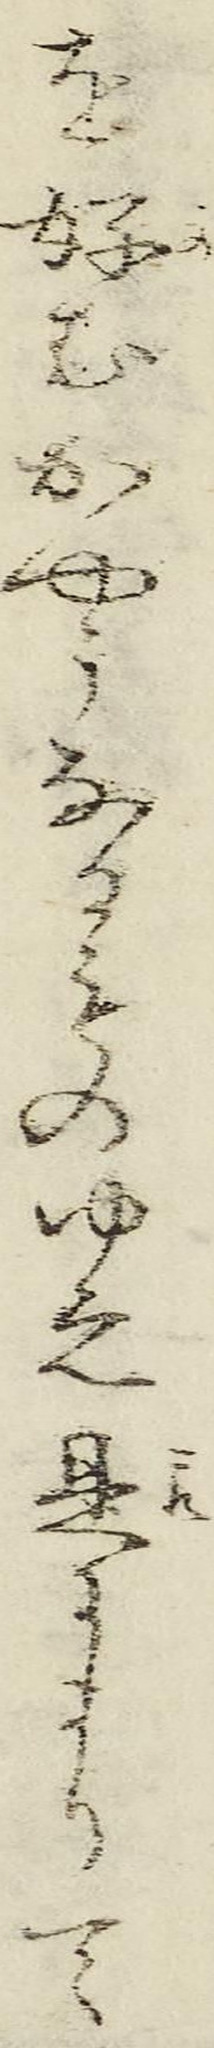を好むかやうなるものゆえ是によりて
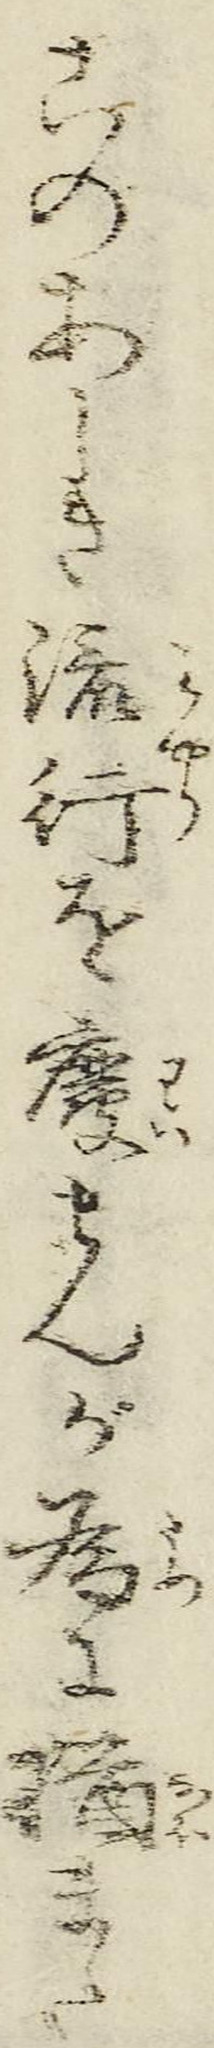このあしき流行を廃さんが為に猶また
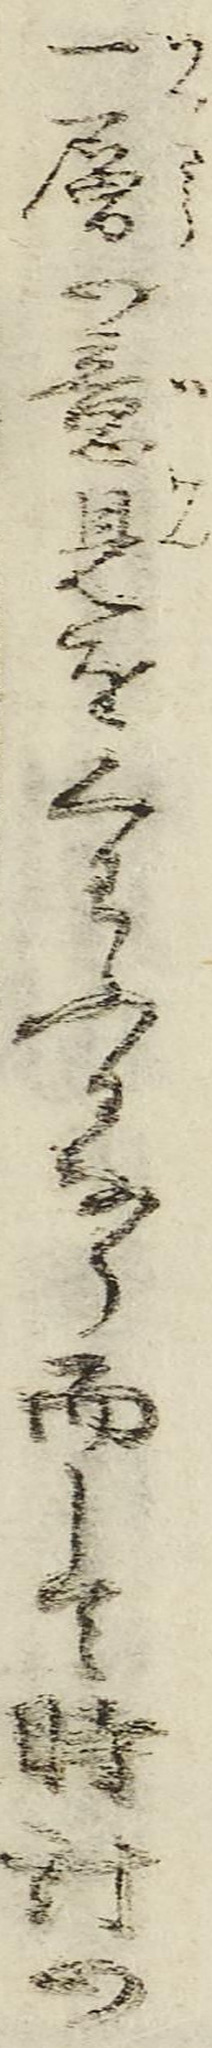一層の意見をくわふるなり而して時計の

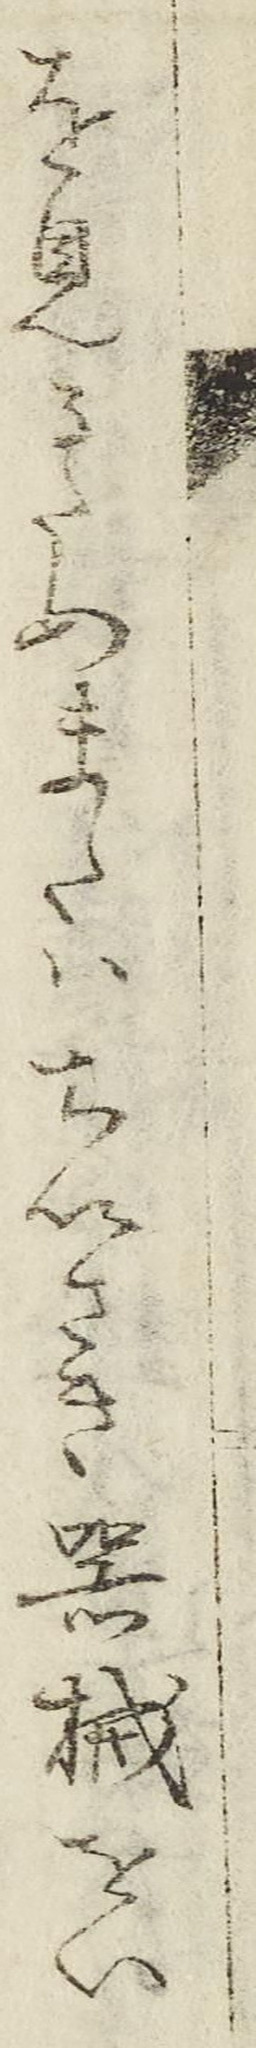を見るためまたはちいさき器械をい
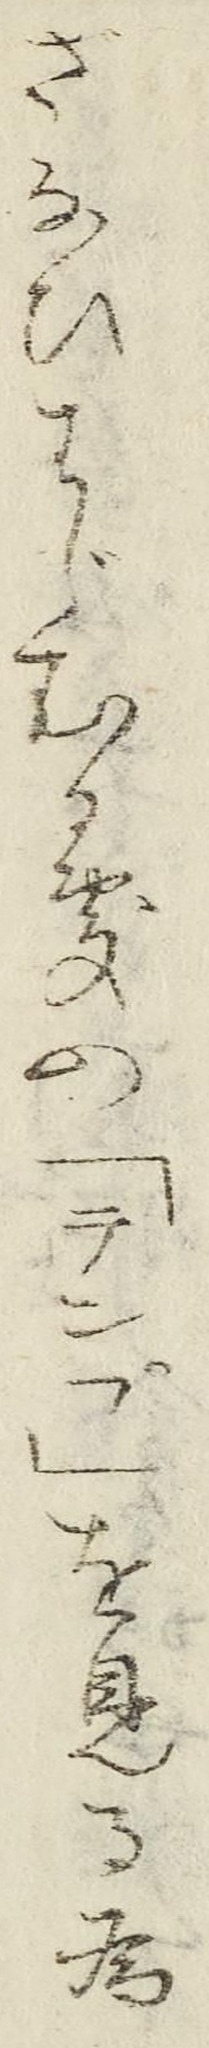ざなひはじむる処の「テンプ」を見る為
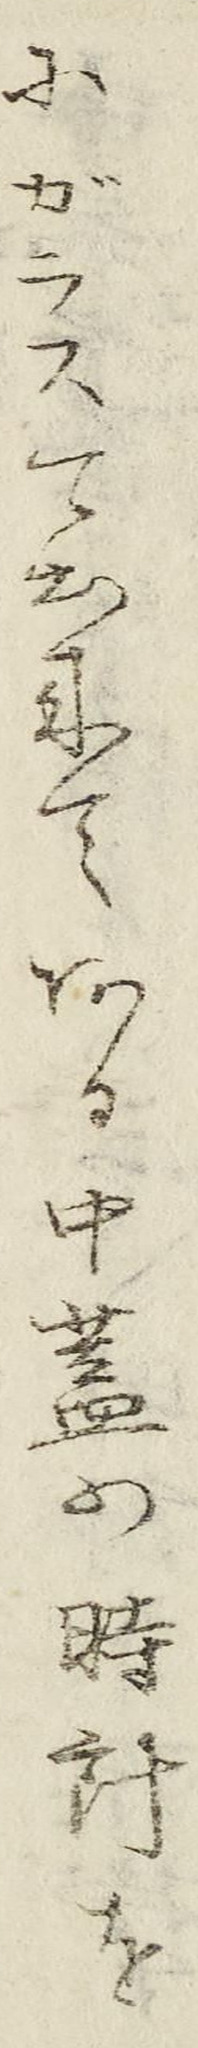にガラスて出来てある中蓋の時計を
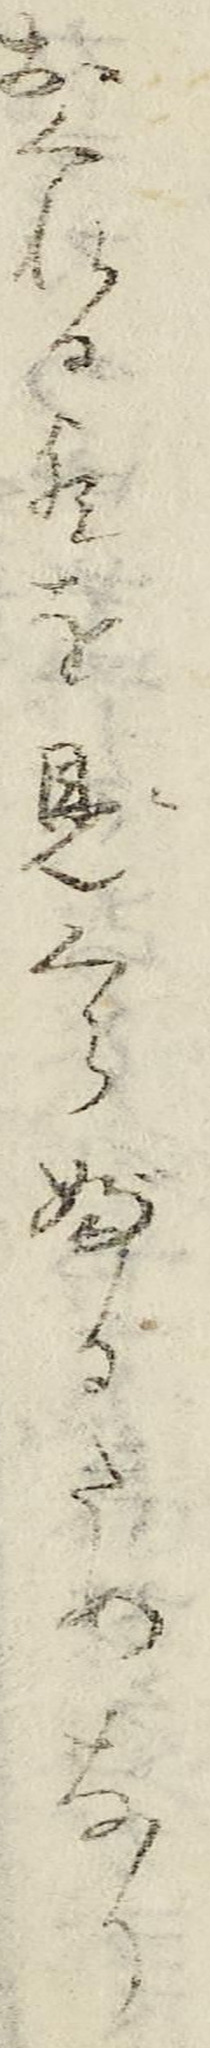おくれるかを見くらぶるためなり
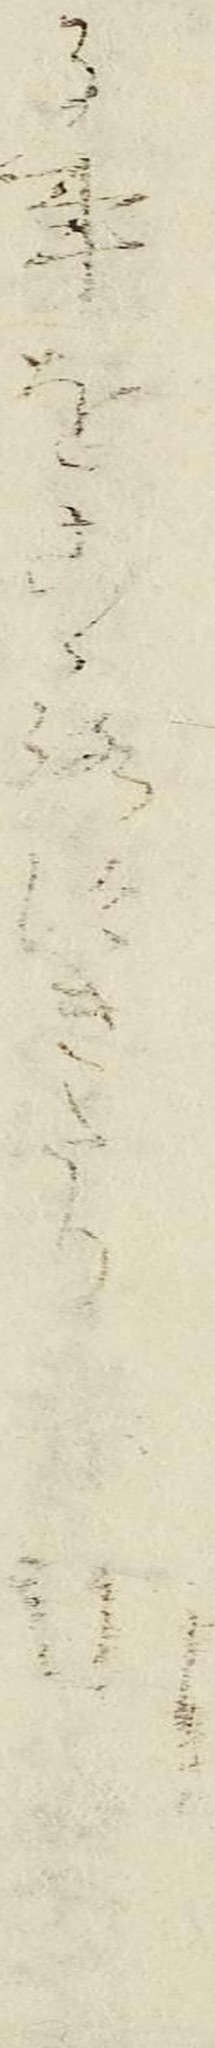る事をこゝろつきたり
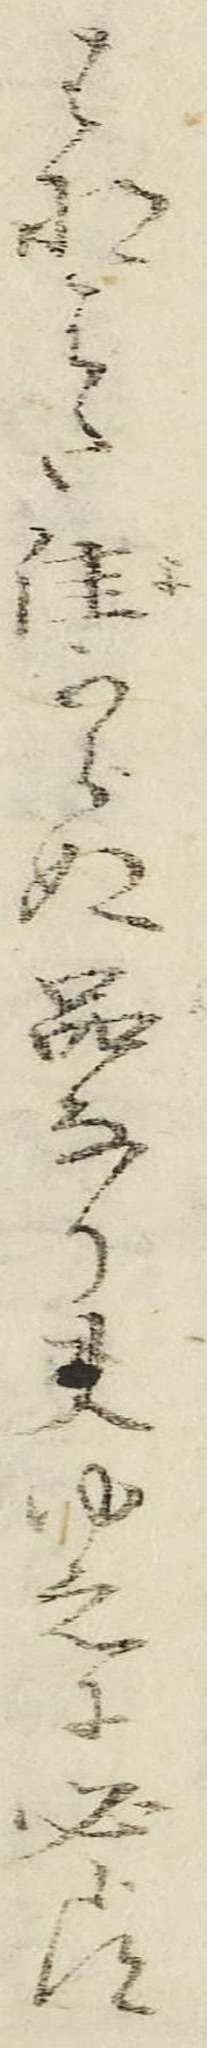はなはた佳よからぬ品なり夫ゆえに必らす

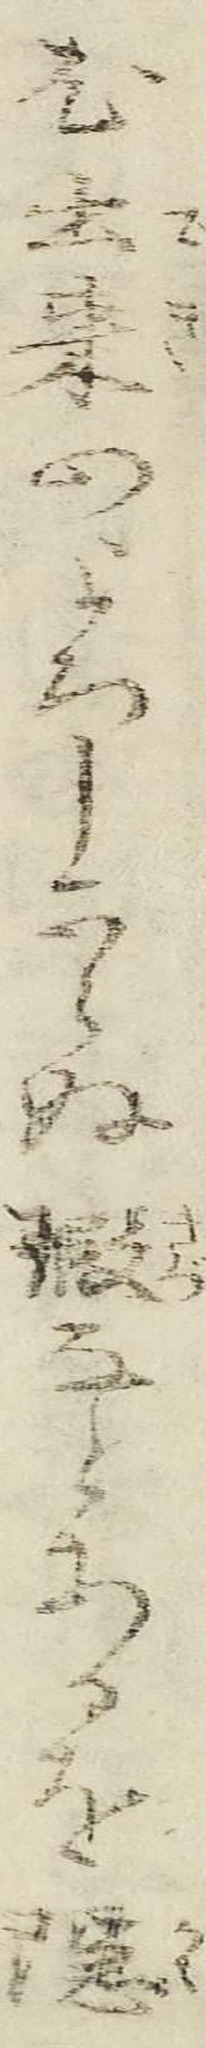尤出来のよろしからぬ瑕なとあるを隠
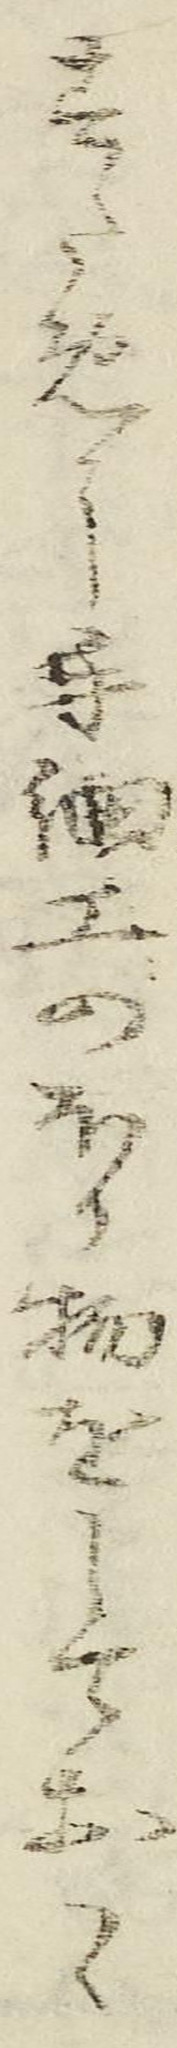すために手細工のほり物をしておく
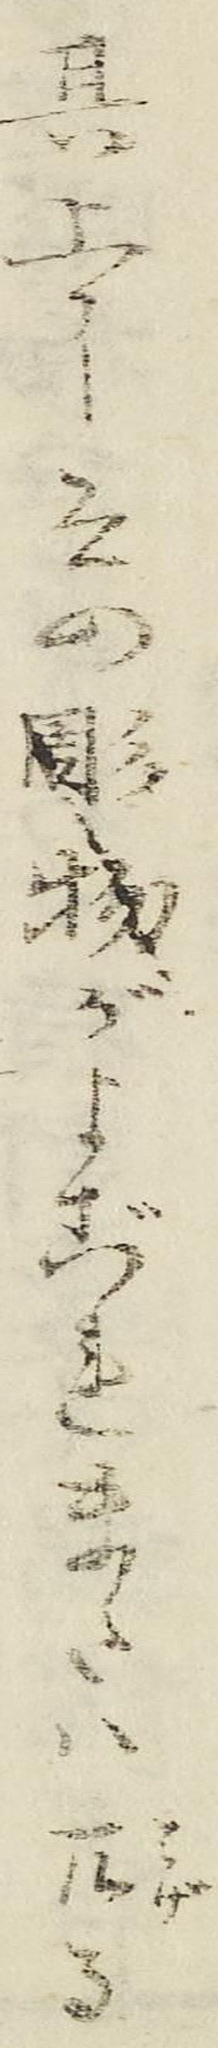其上にその彫物がよごれまたは仄る
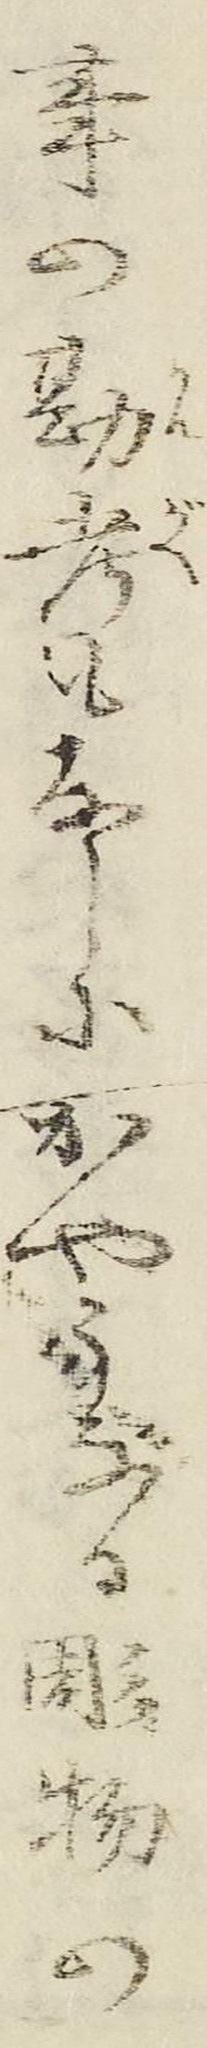事の勘考もなしにかやうなる彫物の
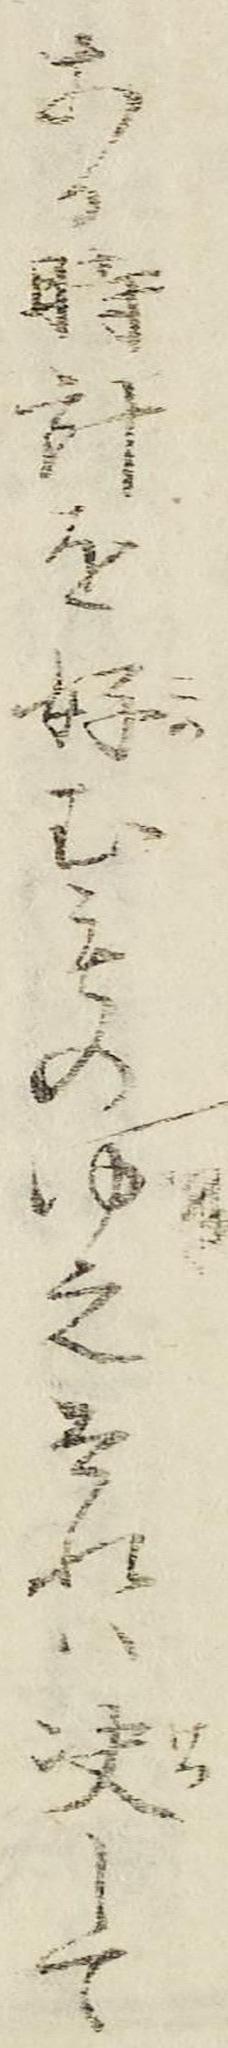ある時計を好むものゆえそれは決して
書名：[時計に関する冊子]
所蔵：東京大学地震研究所図書室 Earthquake Research Institute Library, The University of Tokyo, JAPAN
